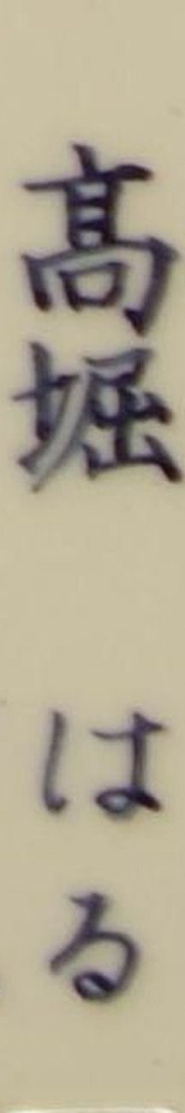高堀はる
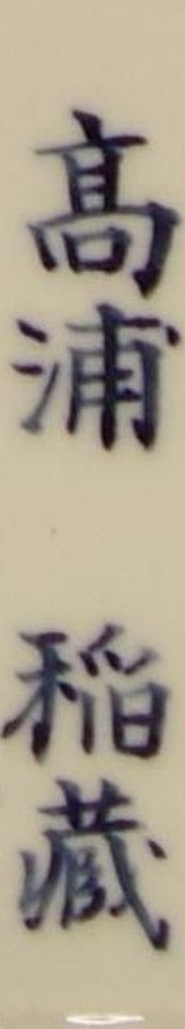高浦稲蔵
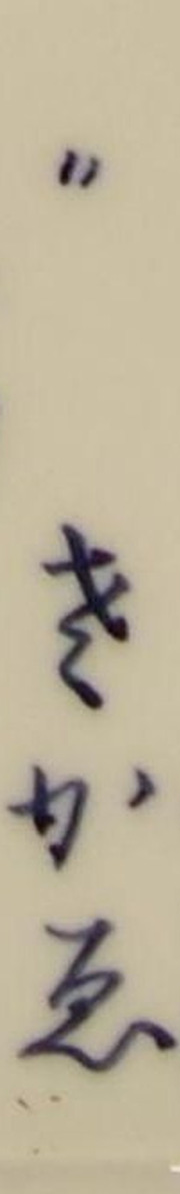さかゑ
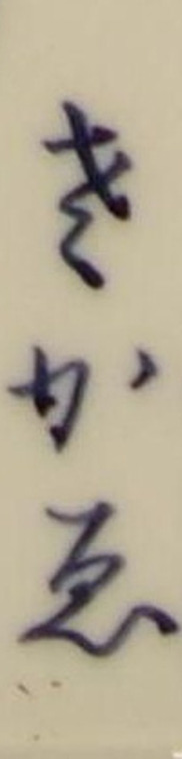さかゑ
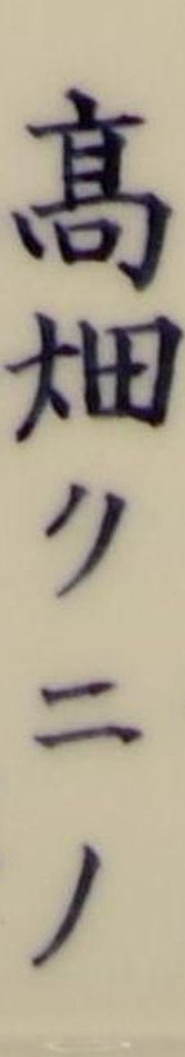高畑ク二ノ
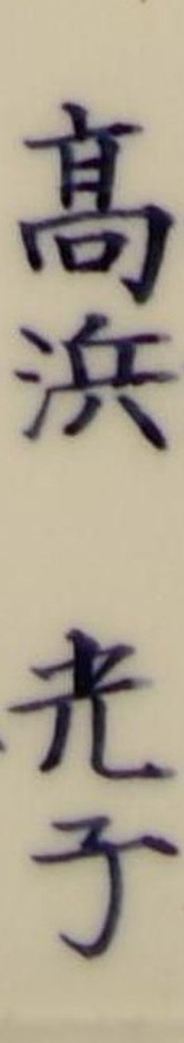高浜光子
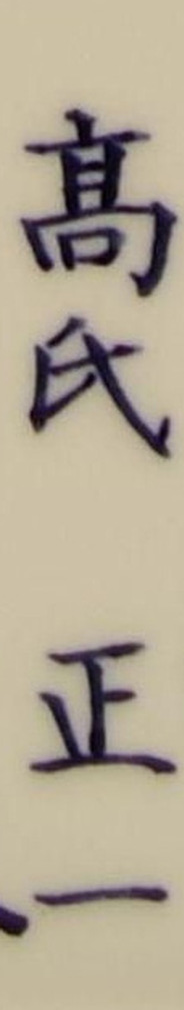高氏正一
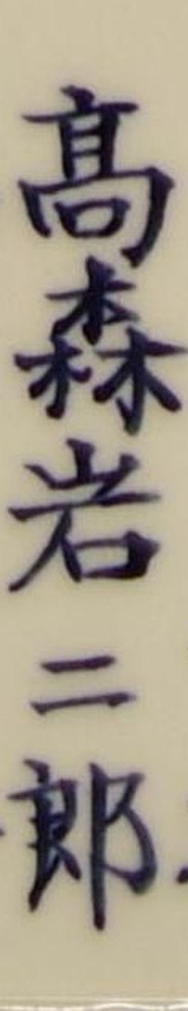高森岩二郎
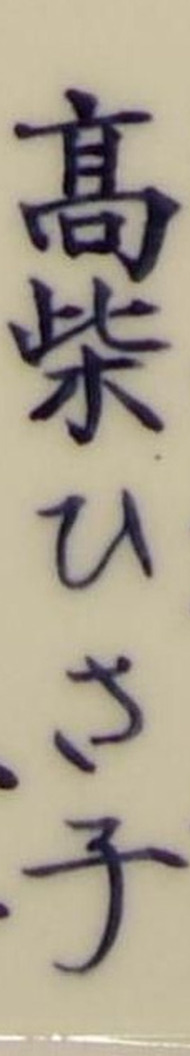高柴ひさ子
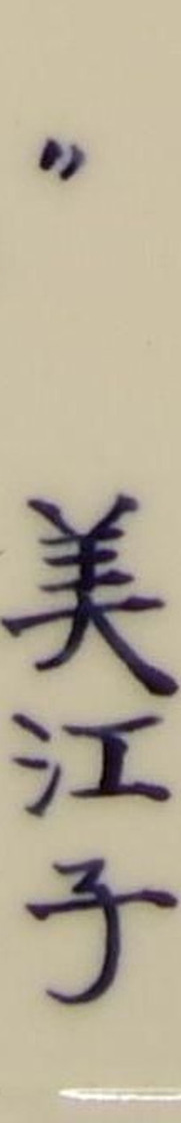美江子
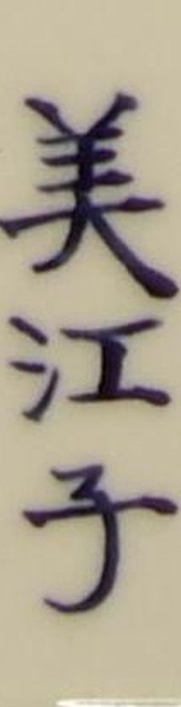美江子
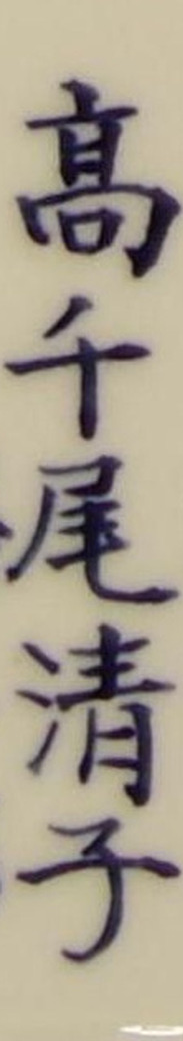高千尾清子
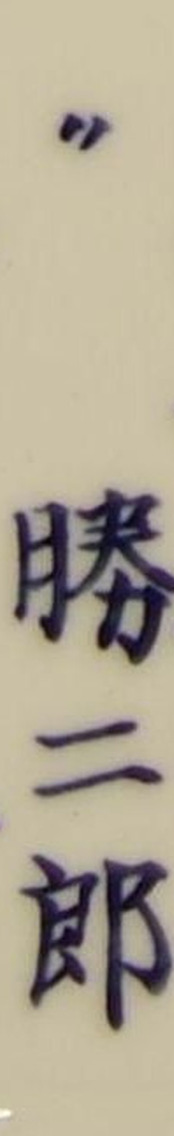勝二郎
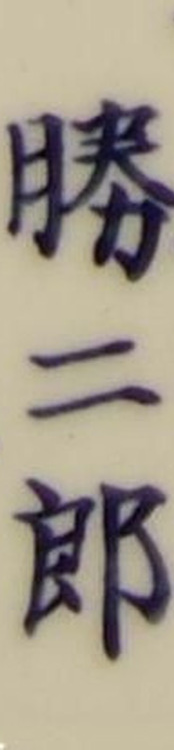勝二郎
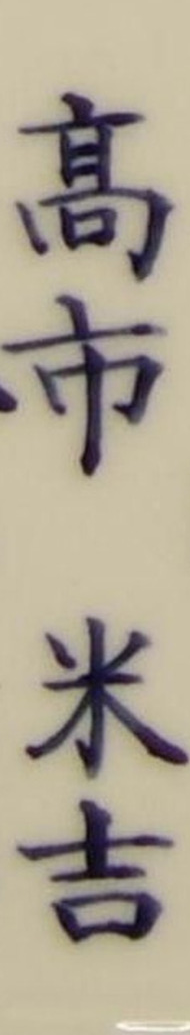高市米吉
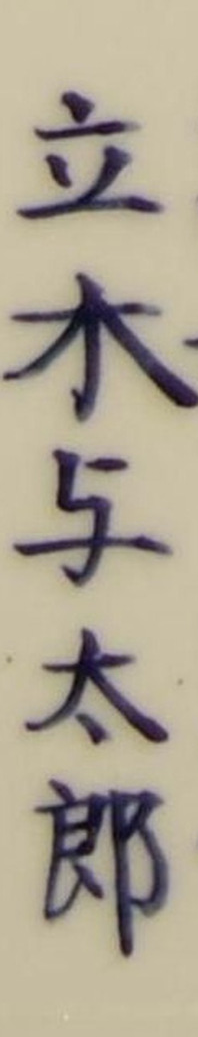立木与太郎
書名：E~L
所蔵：高野山金剛峯寺
